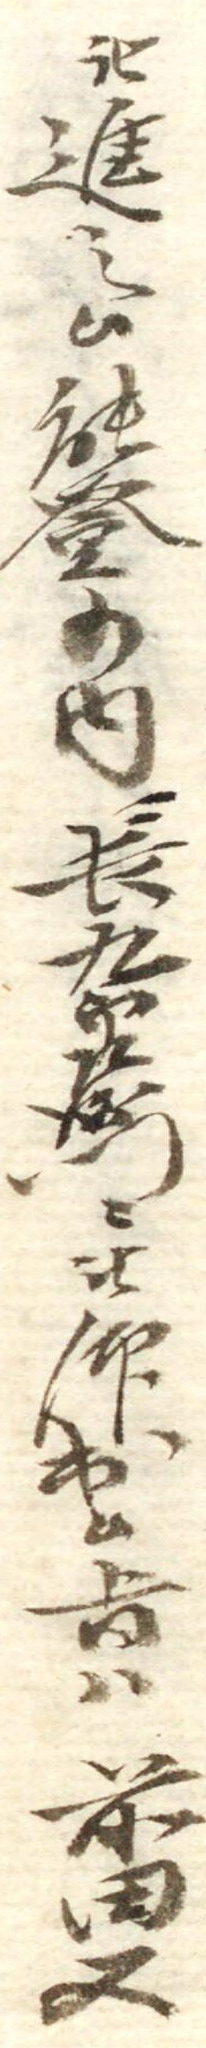被進之候能登の内長九郎左衛門に被仰出候旨は前田又
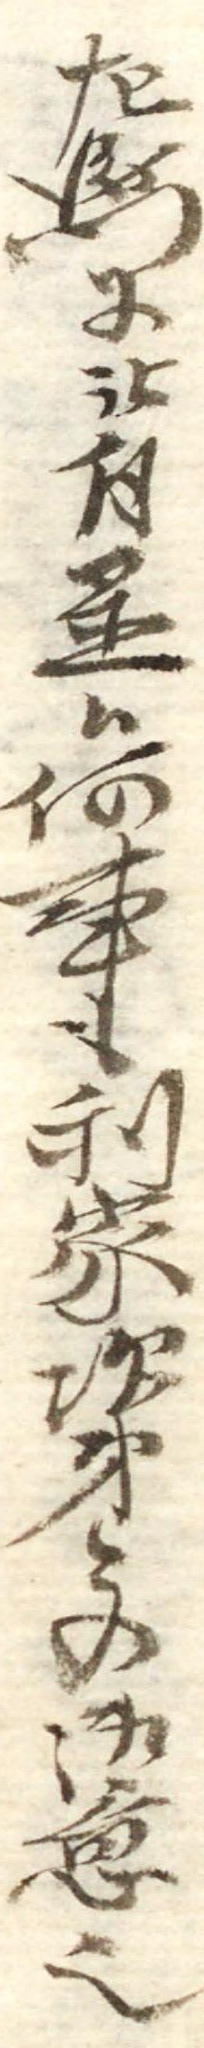左衛門尓被付置候何事も利家次第との御意也
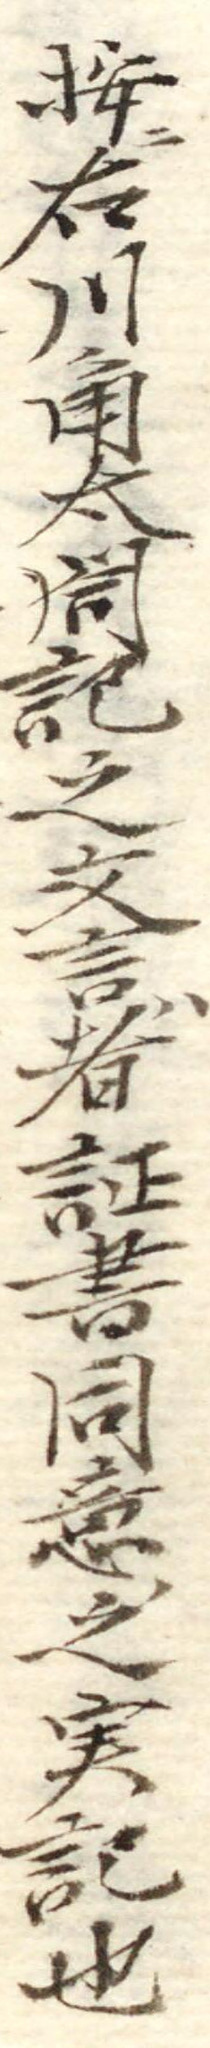按に右川角太閤記之文言者証書同意之実記也
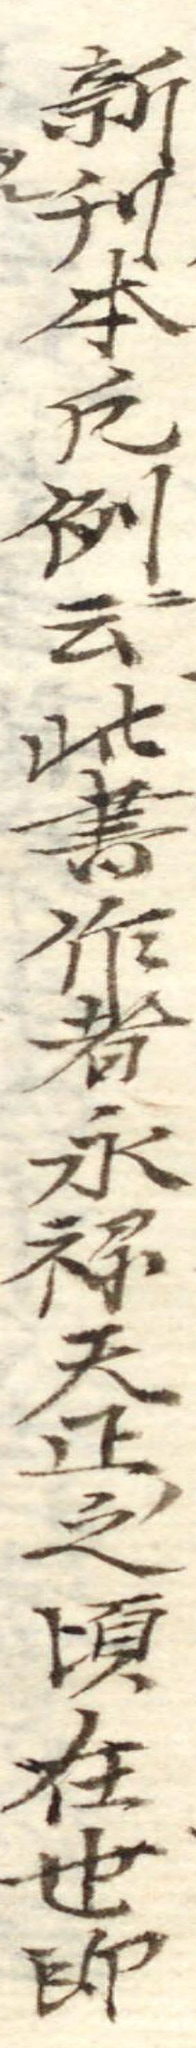新刊本凡例に云此書作者永禄天正之頃在世郎
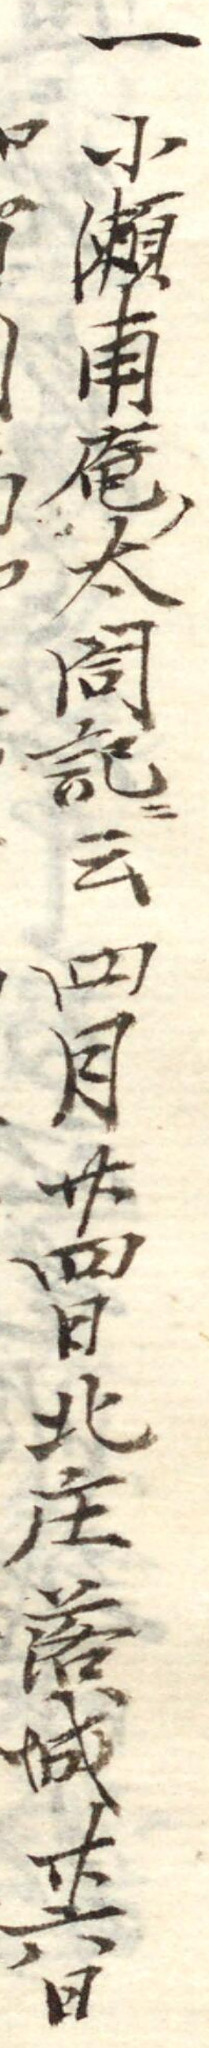一小瀬甫庵の太閤記に云四月廿四日北庄落城廿六日
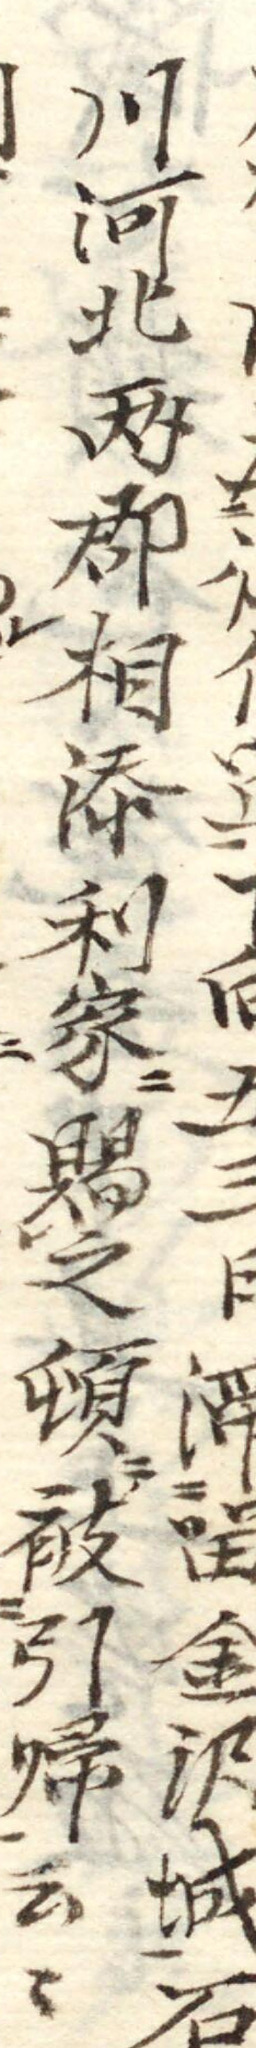川河北両郡相添利家に賜之頓て被引帰云々
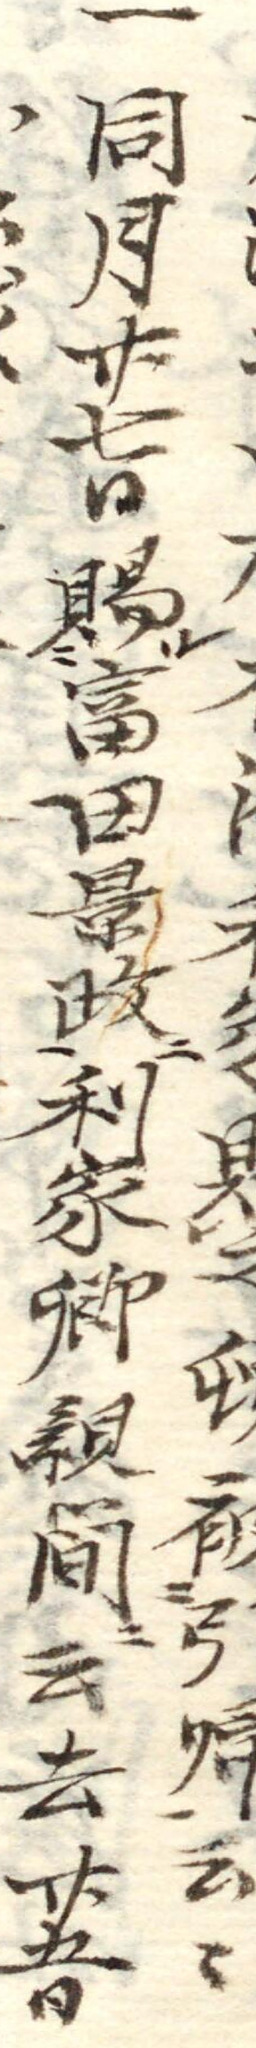一同月廿七日賜る富田景政に利家卿親簡に云去廿五日
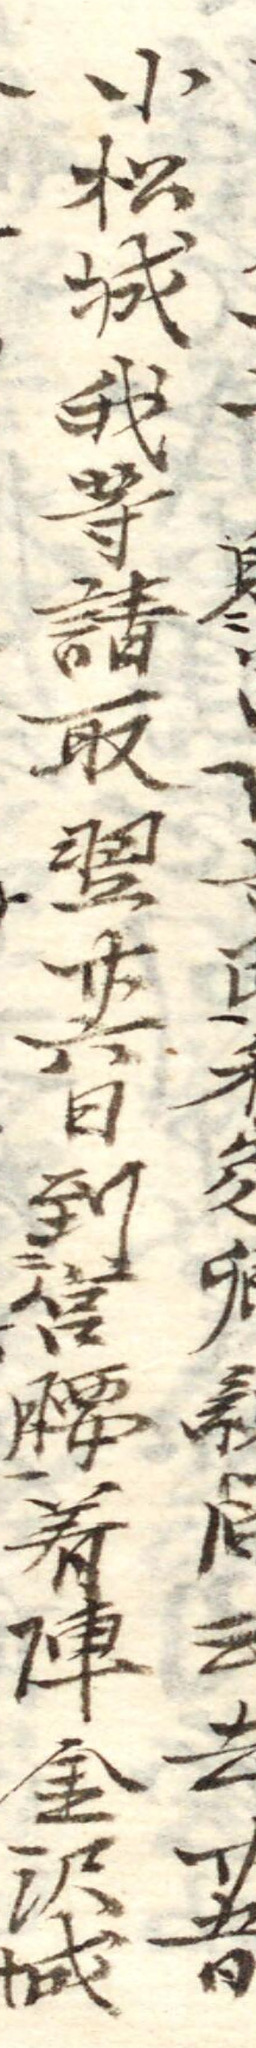小松城我等請取翌廿六日到宮腰着陣金沢城
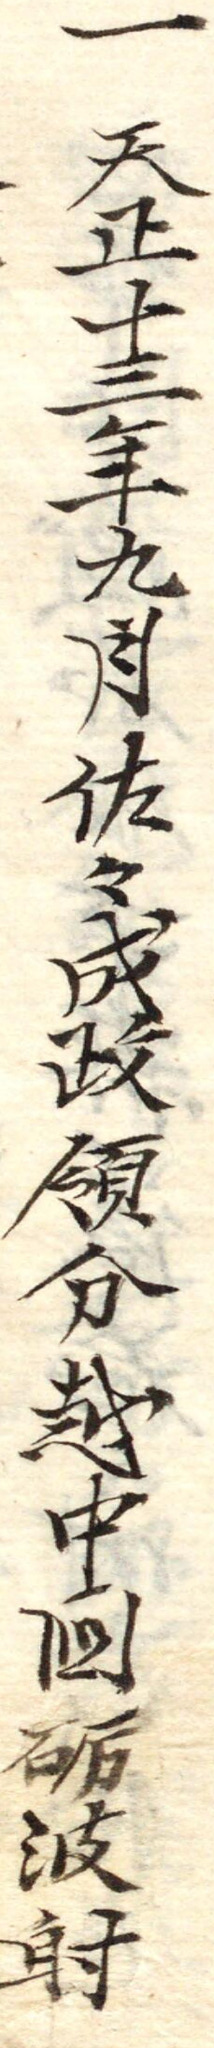一天正十三年九月佐々成政領分越中国砺波射
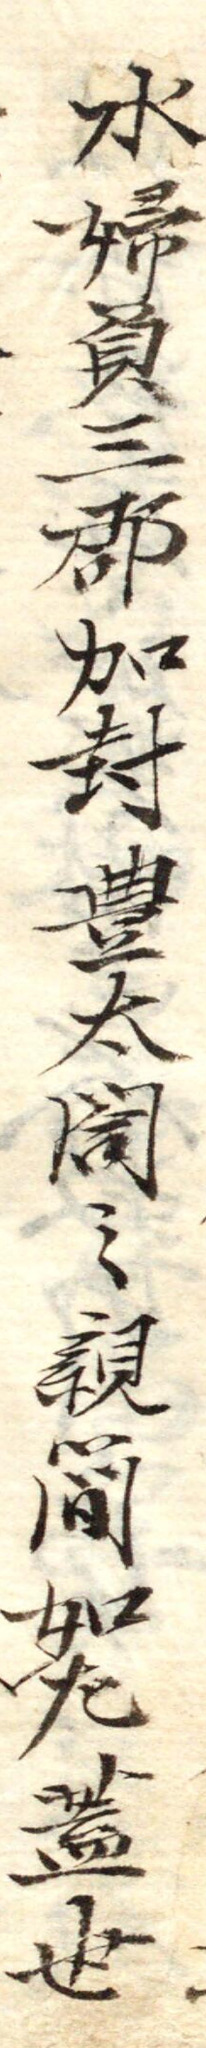水婦負三郡加封豊太閤之親簡如左蓋世
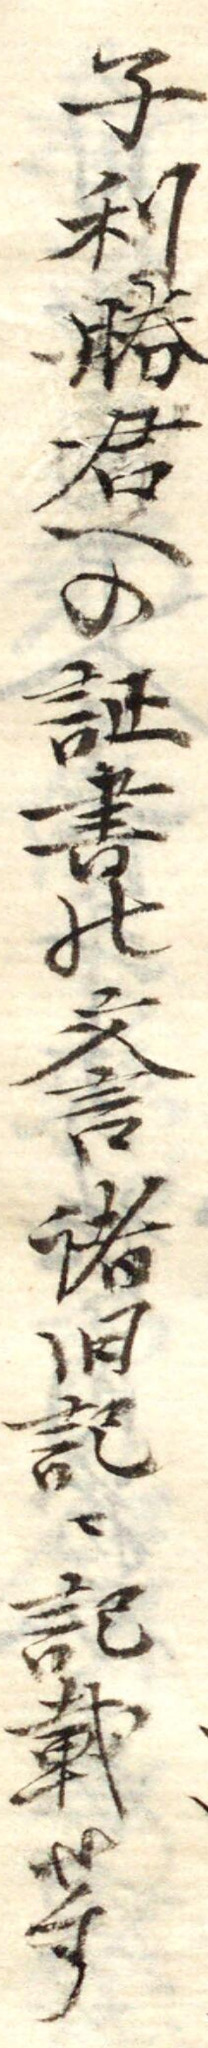子利勝君への証書能文言諸旧記に記載せす

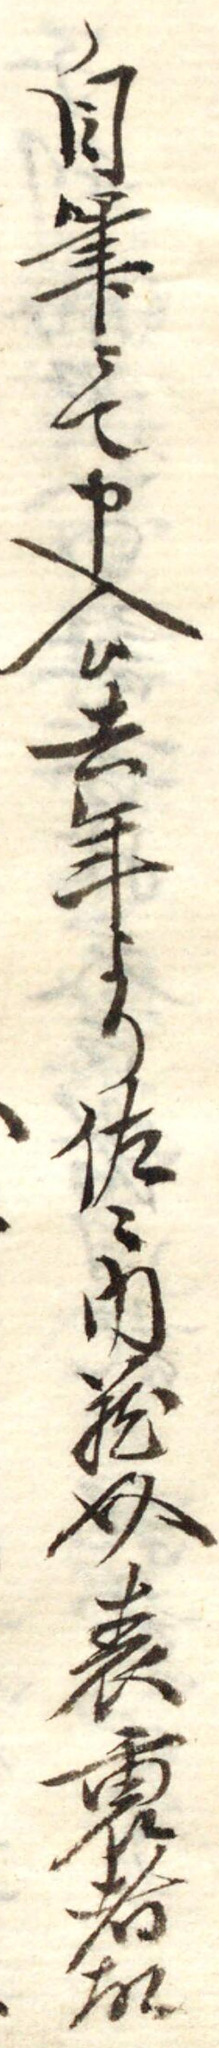自筆にて申入候去年より佐々内蔵介表裏者故
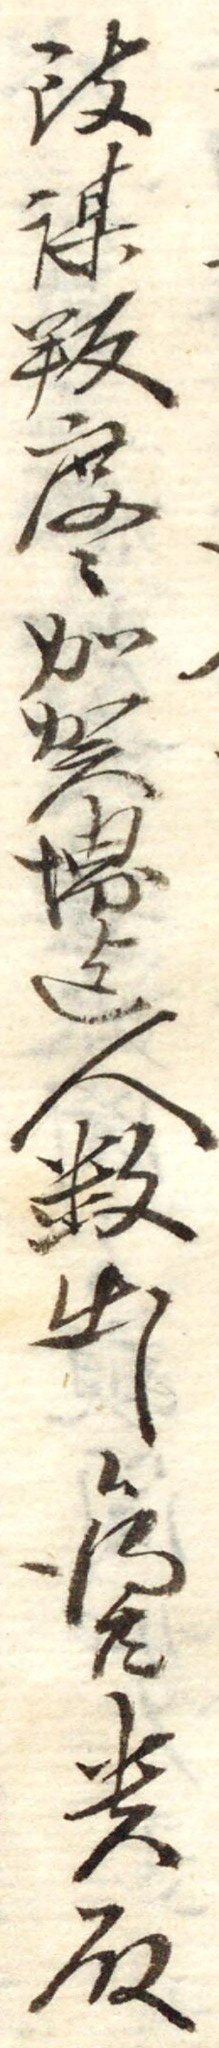致謀叛度々加賀堺迄人数出し候得共貴殿
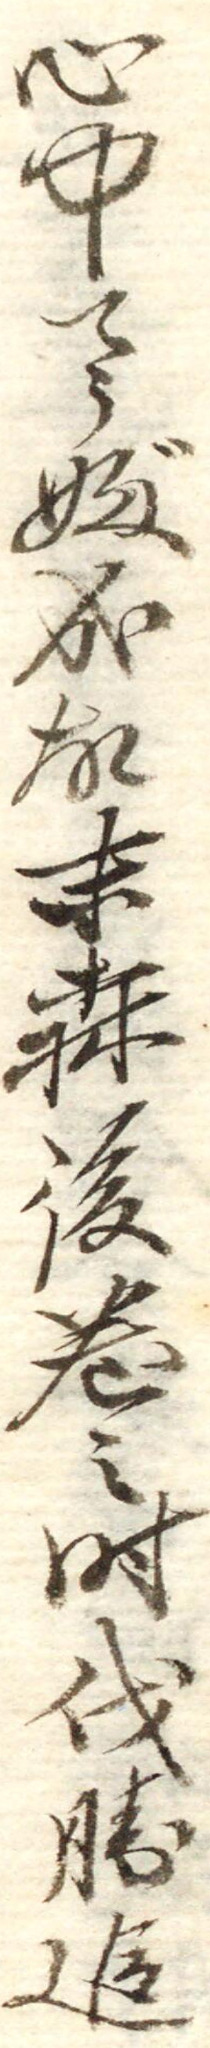心中てう婦成故末森後巻之時伐勝追
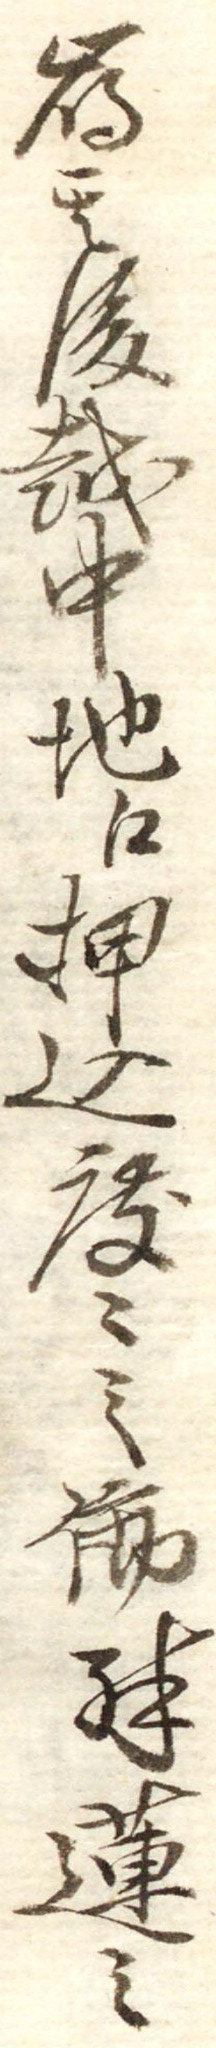岸其後越中地江押込度々之働殊蓮之
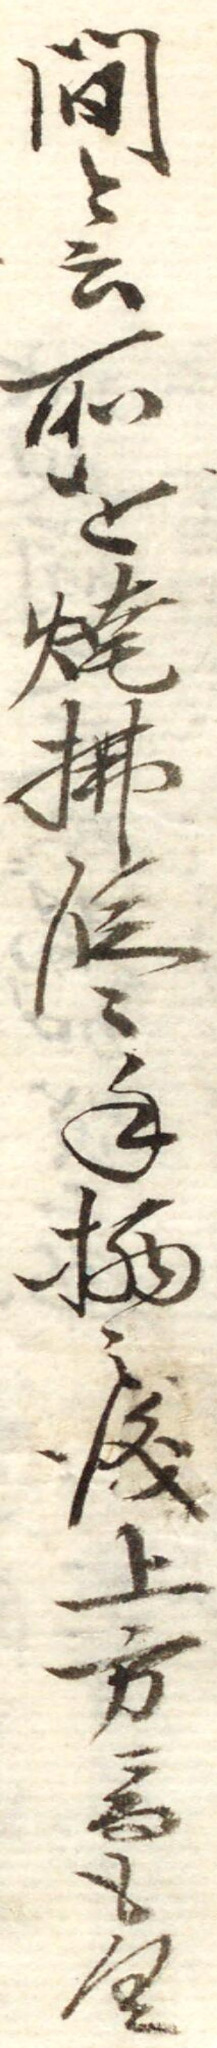間と云所を焼払段々手柄之儀上方に而も具
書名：前田家封国証書集録
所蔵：Ishikawa Prefectural Library
